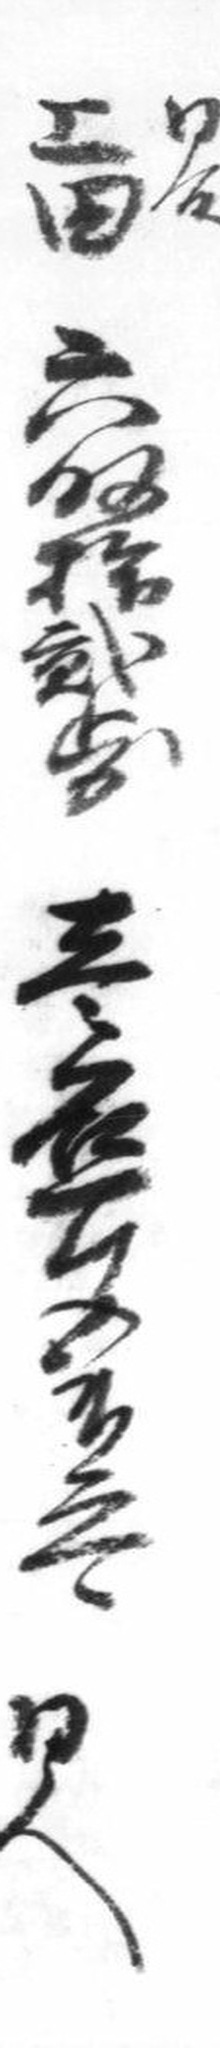上田六畝拾弐歩壱石一斗五升二合同人

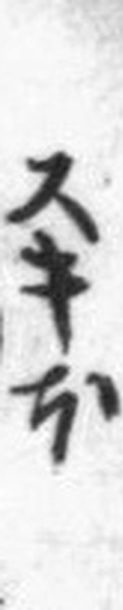スキ本
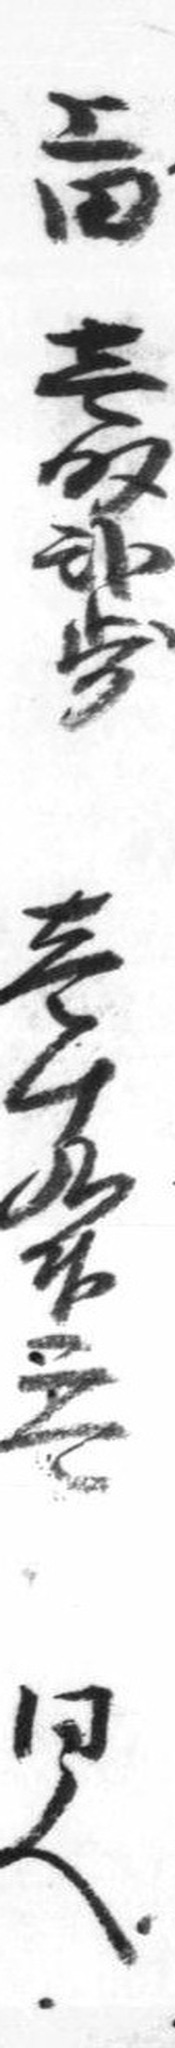上田壱畝弐歩壱斗九升二合同人
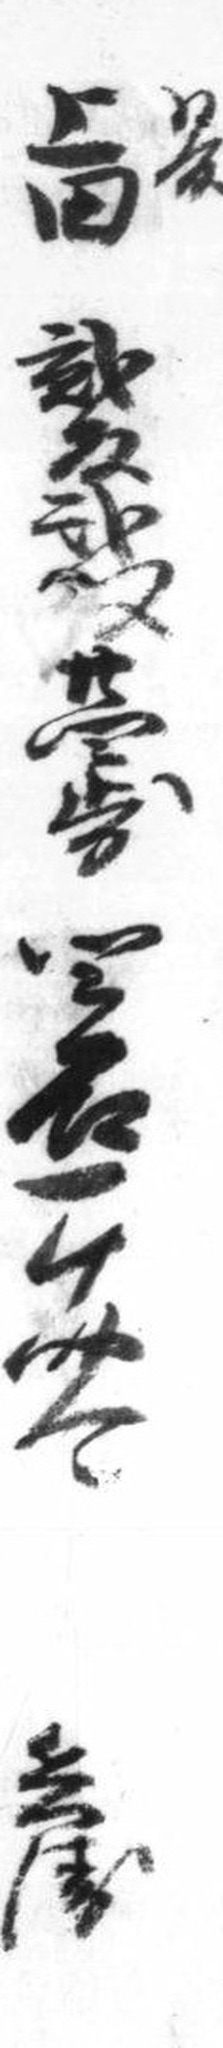上田弐反弐畝廿四歩四石一斗四合兵衛
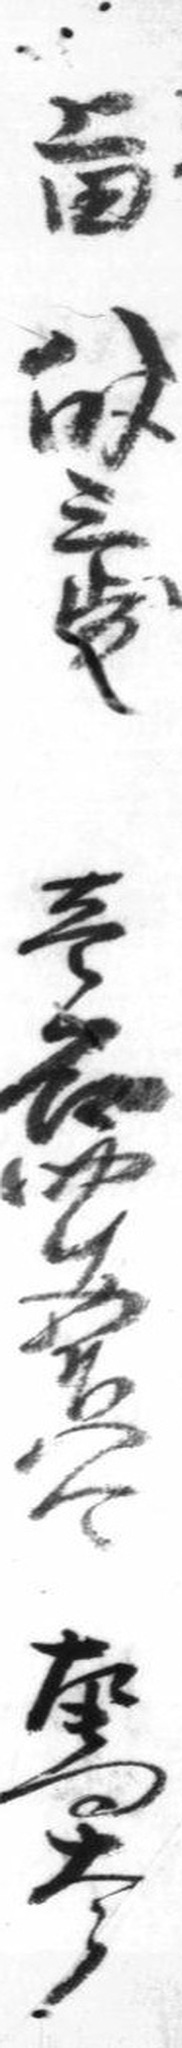上田八畝三歩壱石四斗五升八合左衛門太郎
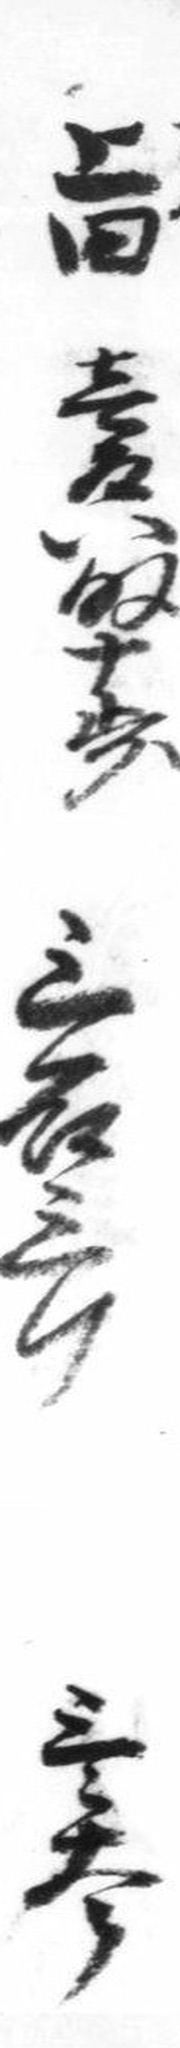上田壱反八畝十歩三石三斗三郎太郎
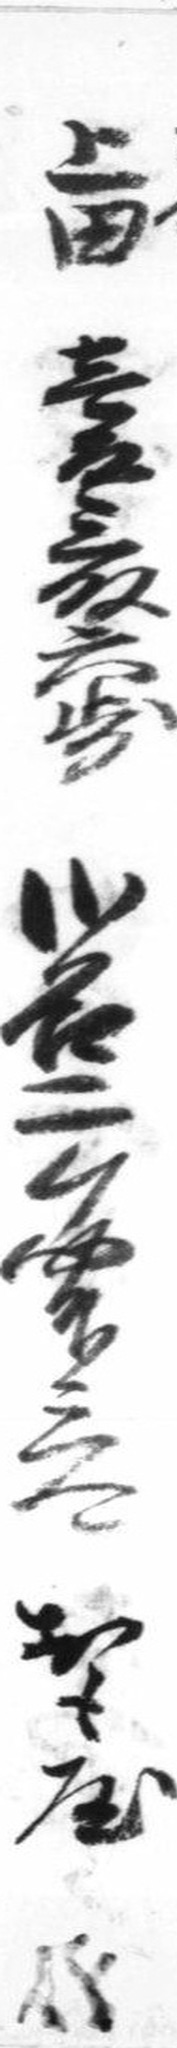上田壱反三畝六歩弐石二斗四升三合出〆屋
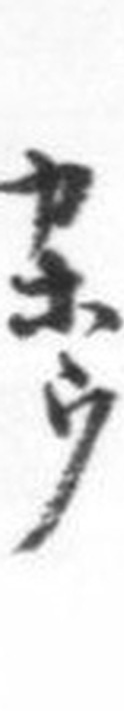カホウ

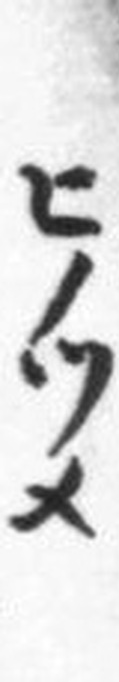ヒノツメ
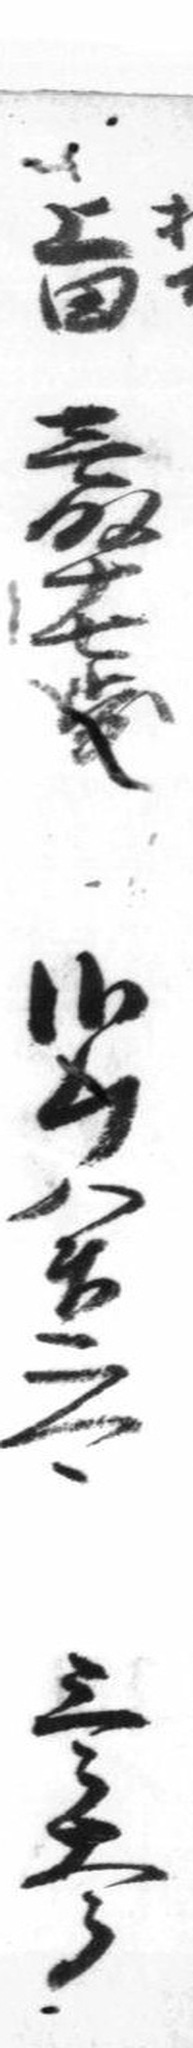上田壱畝十七歩弐斗八升二合三郎太郎
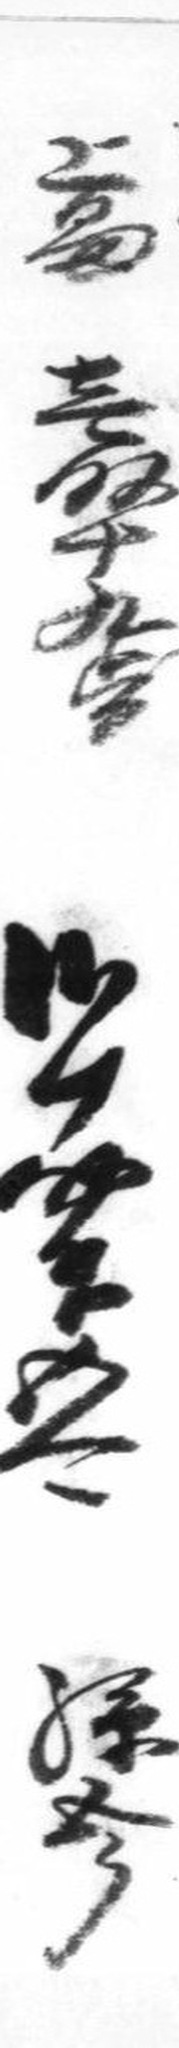上畠壱畝十九歩弐斗四升五合孫五郎
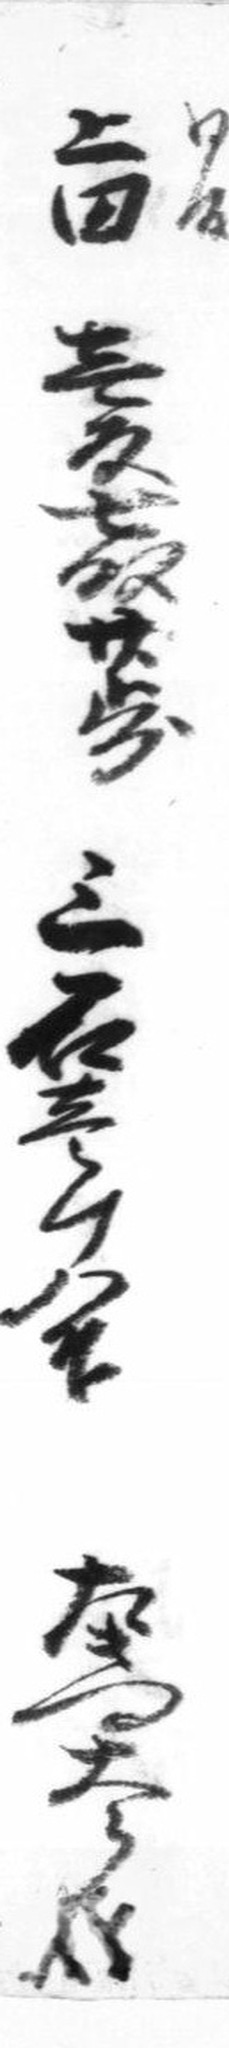上田壱反七畝廿歩三石壱斗八升左衛門太郎
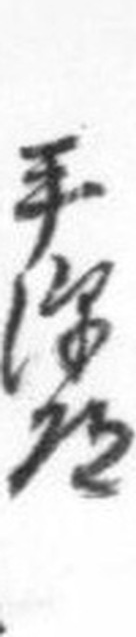平沢道
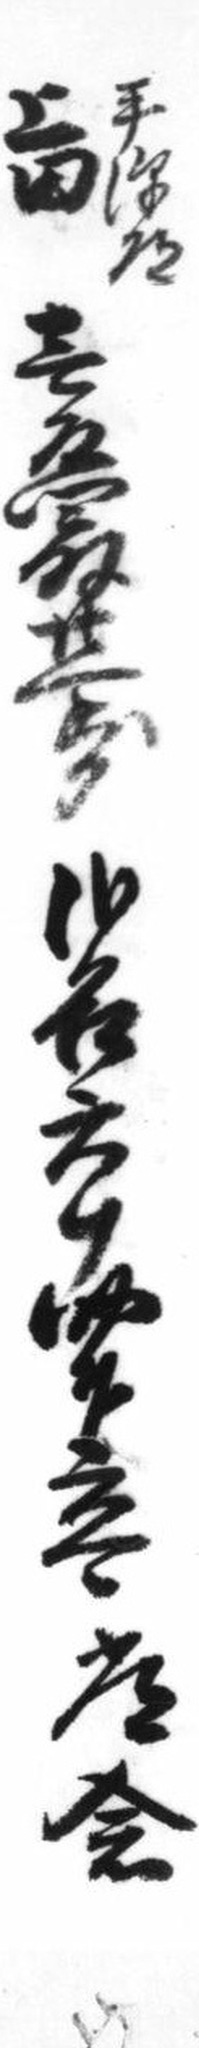上田壱反四畝廿一歩弐石六斗四升六合常念
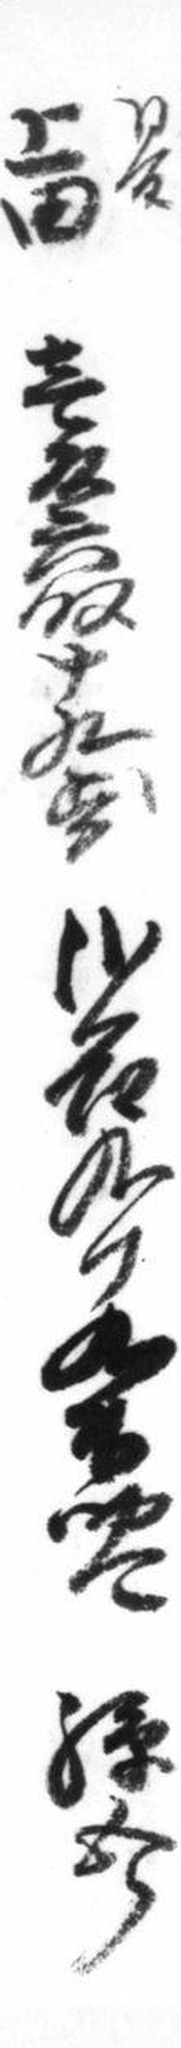上田壱反六畝十九歩弐石九斗九升四合孫五郎
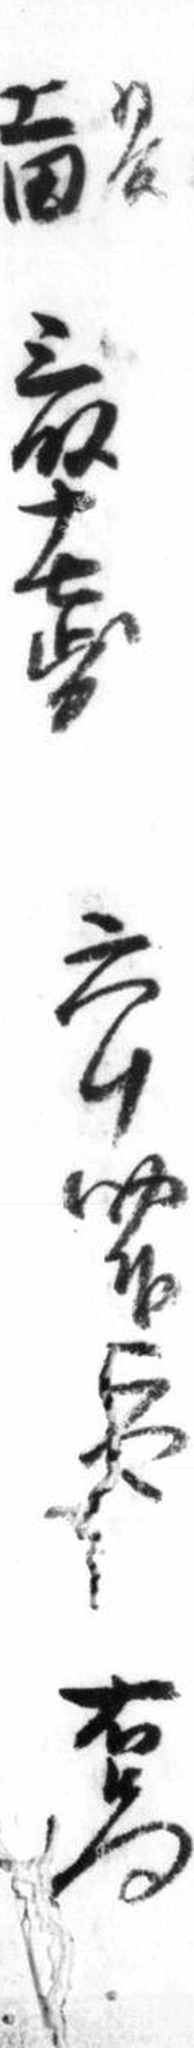上田三畝十七歩六斗四升二合右衛門
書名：越前国大野郡今井村御検地帳
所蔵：福井県文書館 Fukui Prefectural Archives
